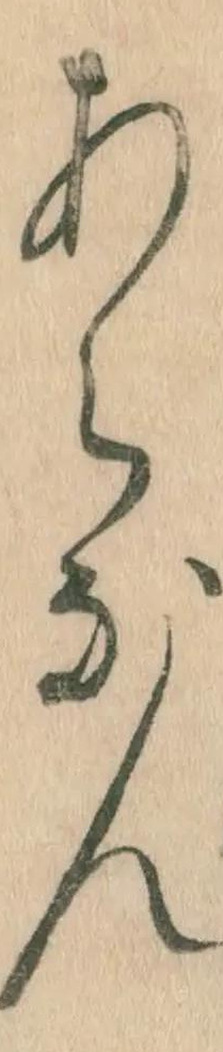あらなん
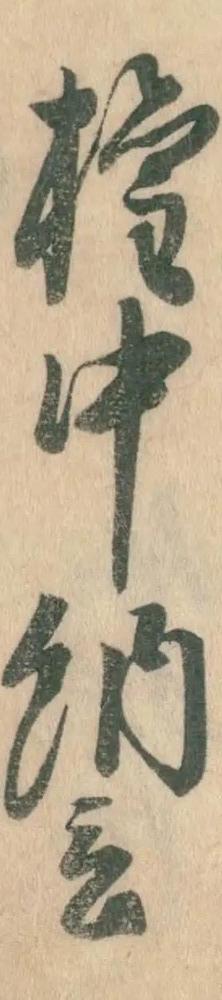權中納言

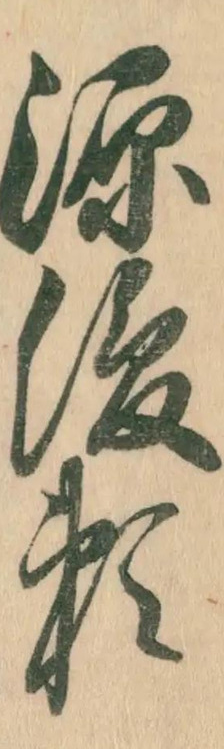源俊頼
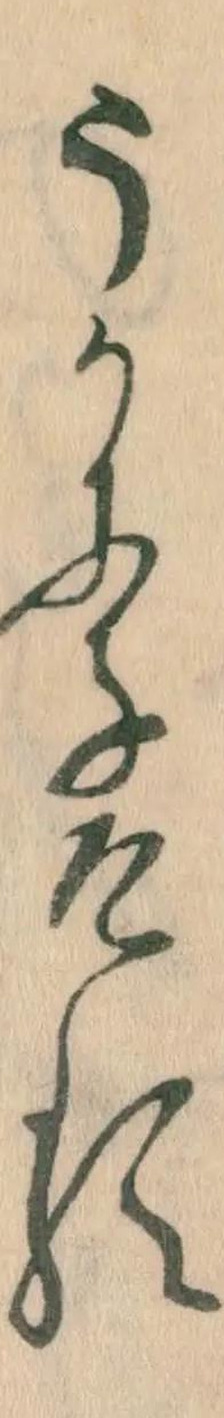うかりける
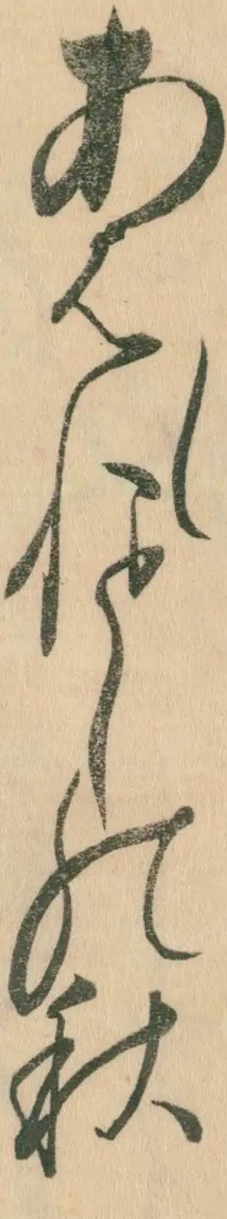あはれことしの秋
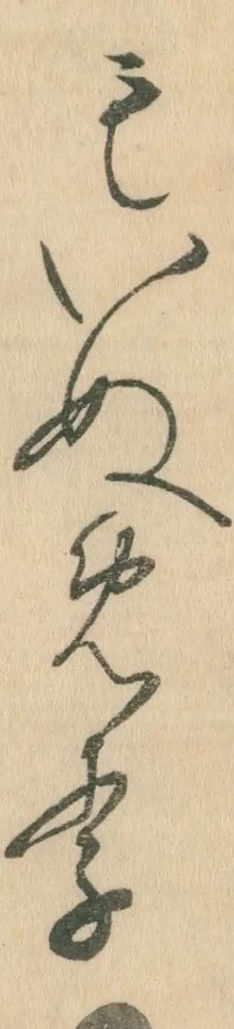もいぬめり
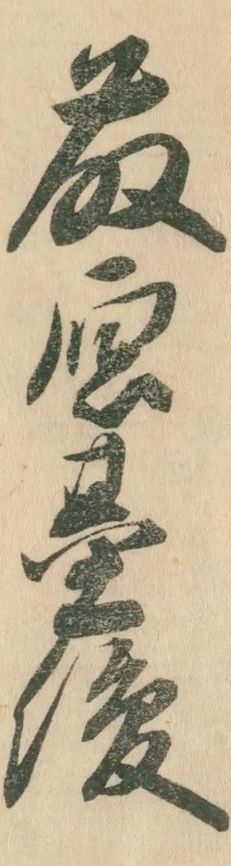藤原基俊
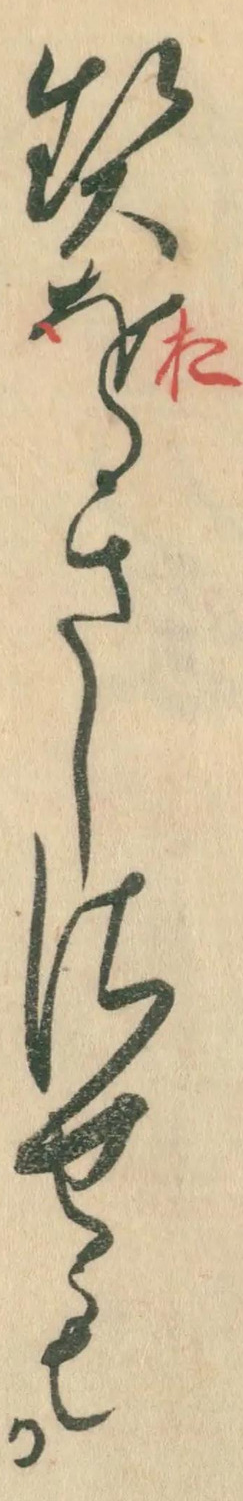契をきしさせもか

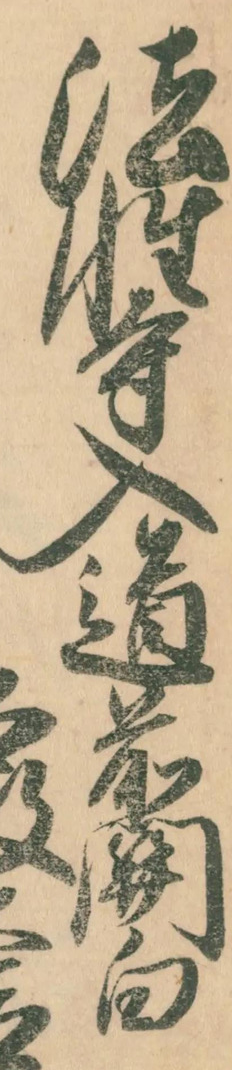法性寺入道前関白
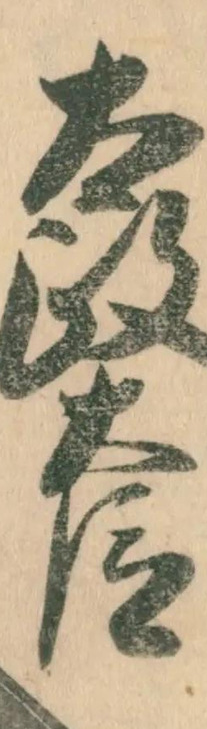太政大臣
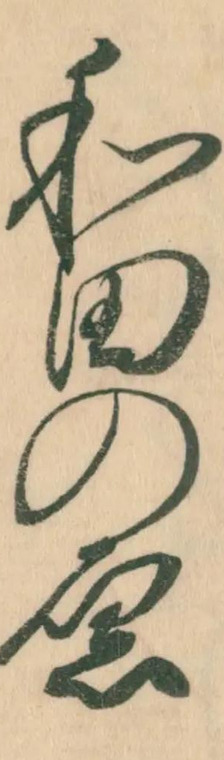和田の原
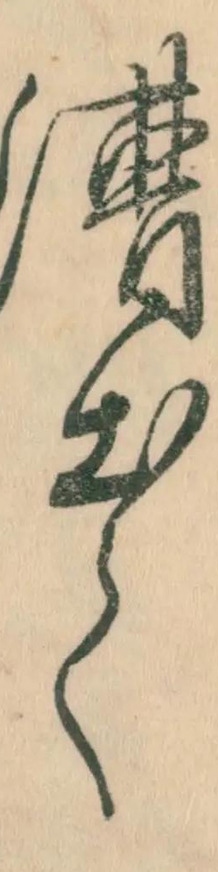漕出て
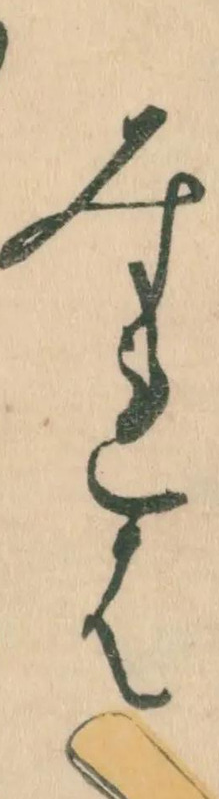みれは
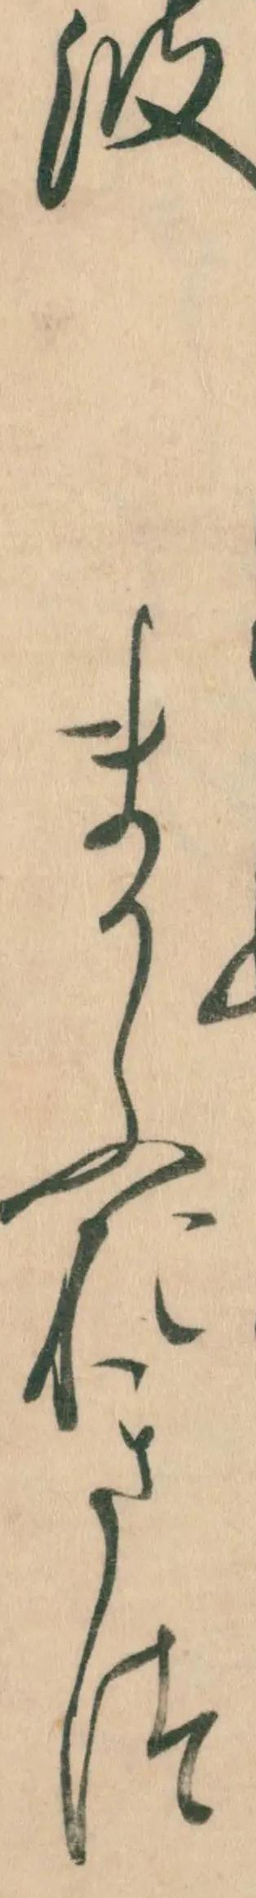波まかふおきつ
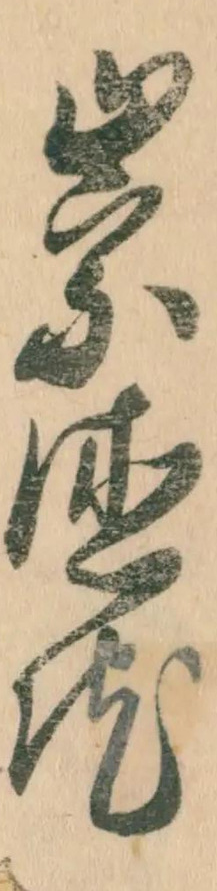崇徳院
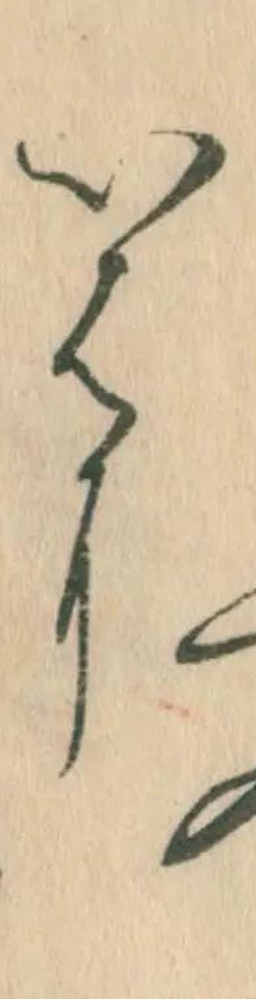いはに
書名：錦百人一首あつま織
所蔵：国立国会図書館 National Diet Library, JAPAN
